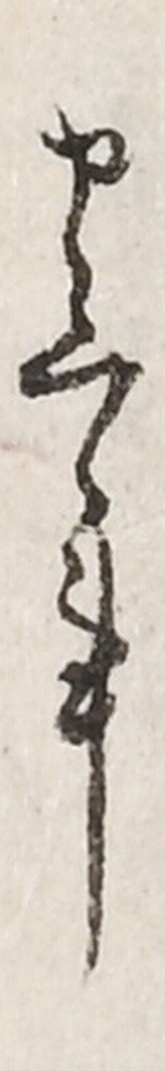申上候事
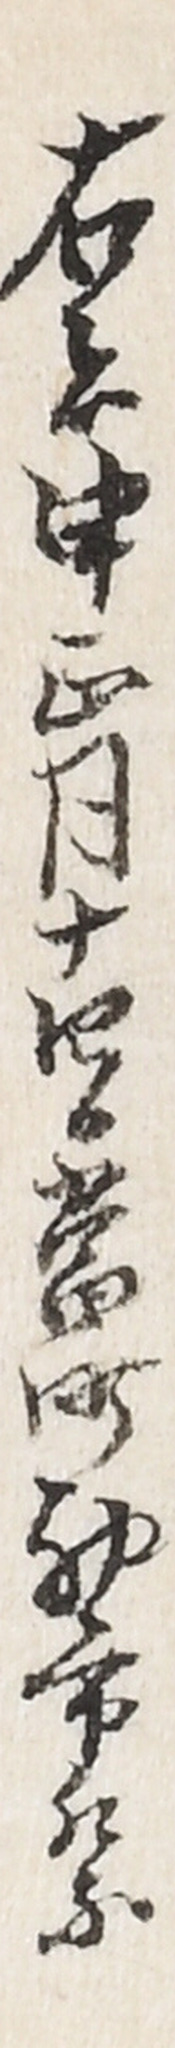右は申正月十四日当町初市祭
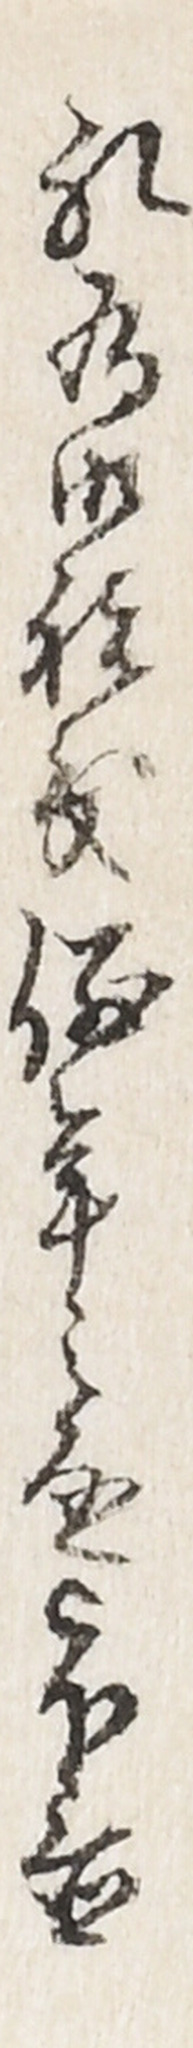礼為御祝義例年之通被下置
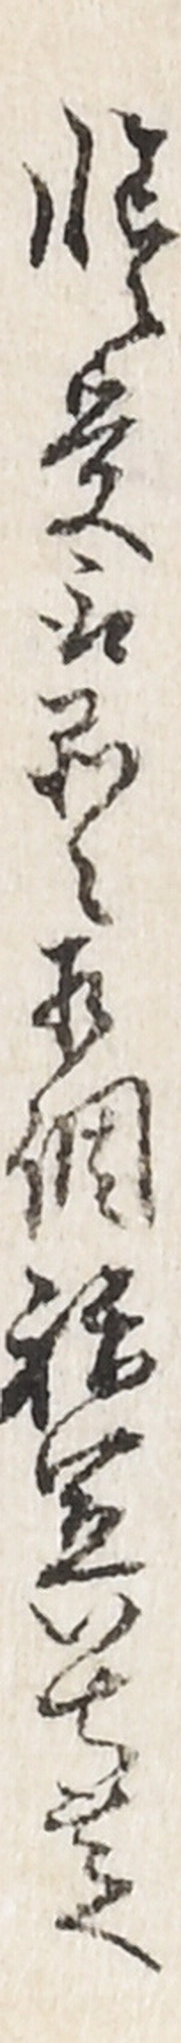慥ニ受取品々相調宜等無之
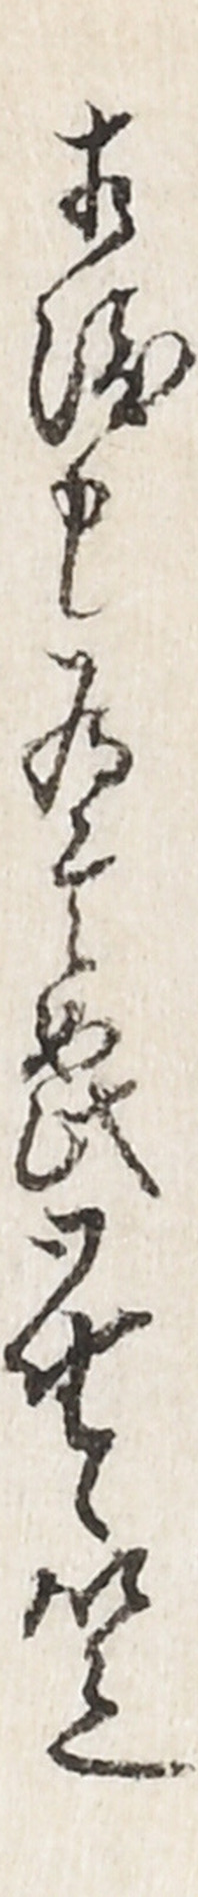相渡申候為其如此御座候以上
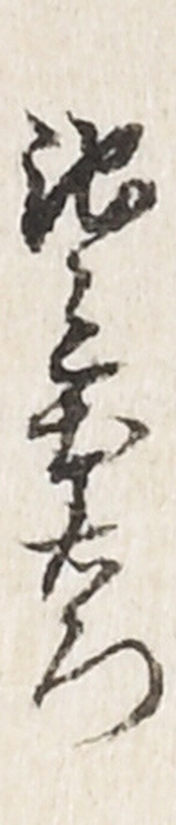申池上本右衛門
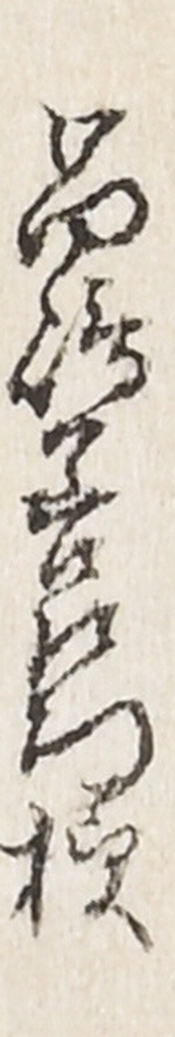冨嶋善右衛門様
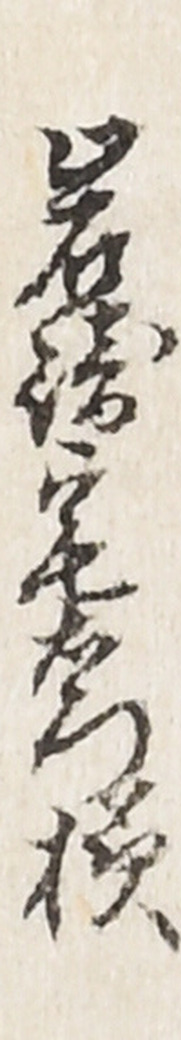岩崎宅右衛門様
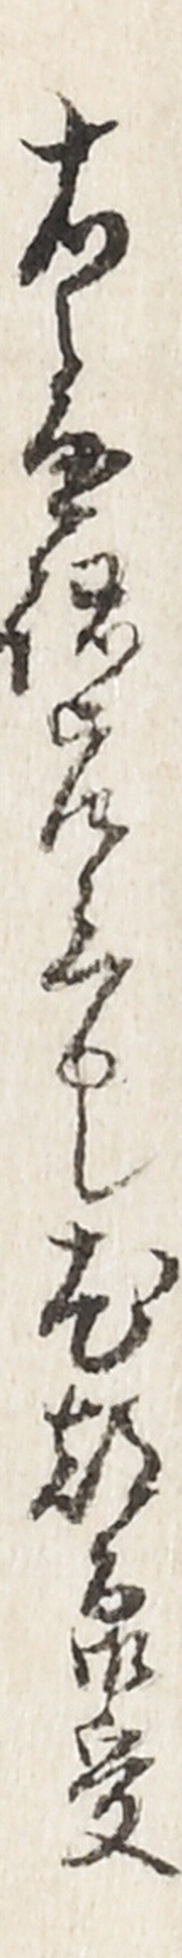右之通借差上申候尤都而御受
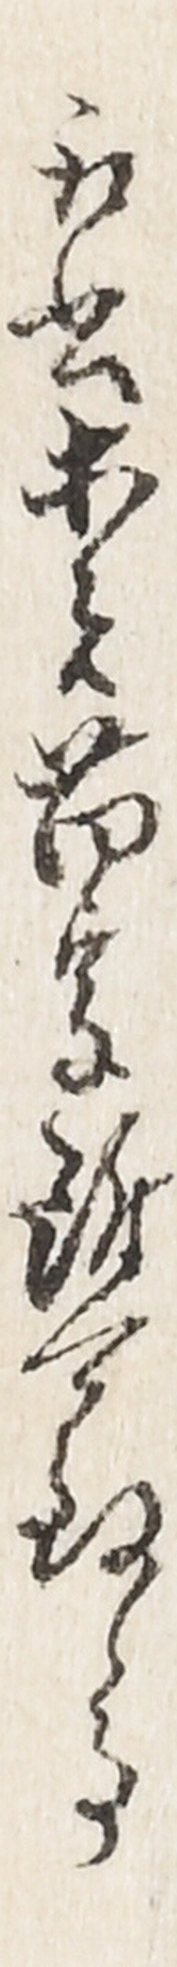初書等は苗字附可致候事
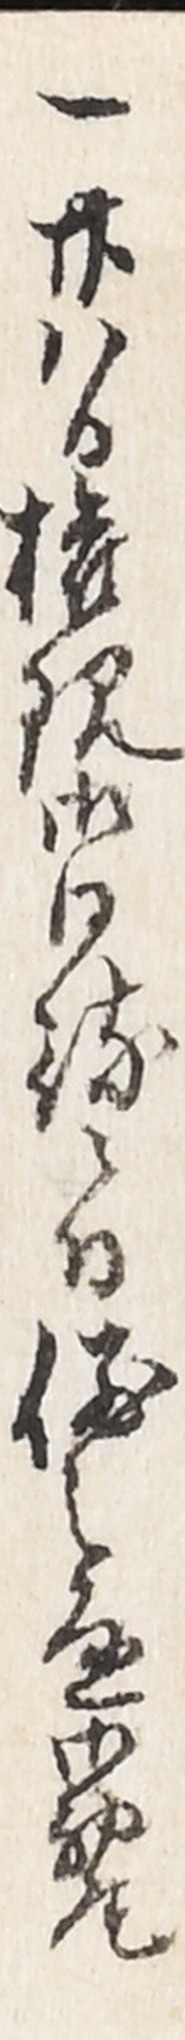一廿八日権現御同流ニ付例之通御初尾
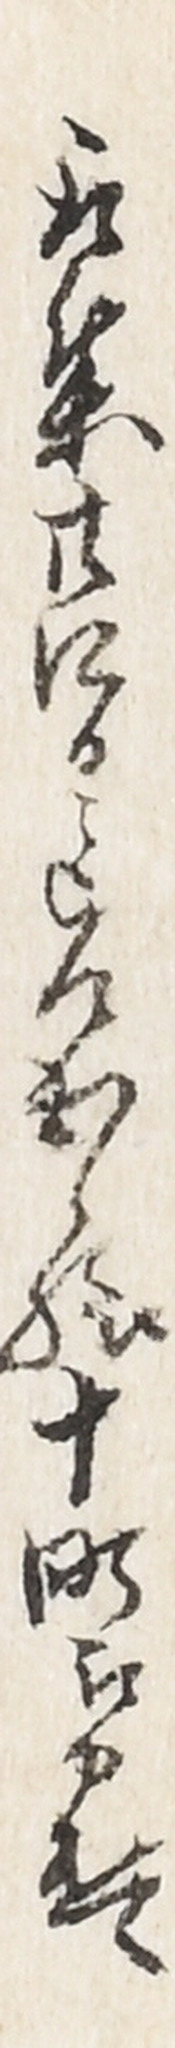取集廿四日差出候様十町江申出候
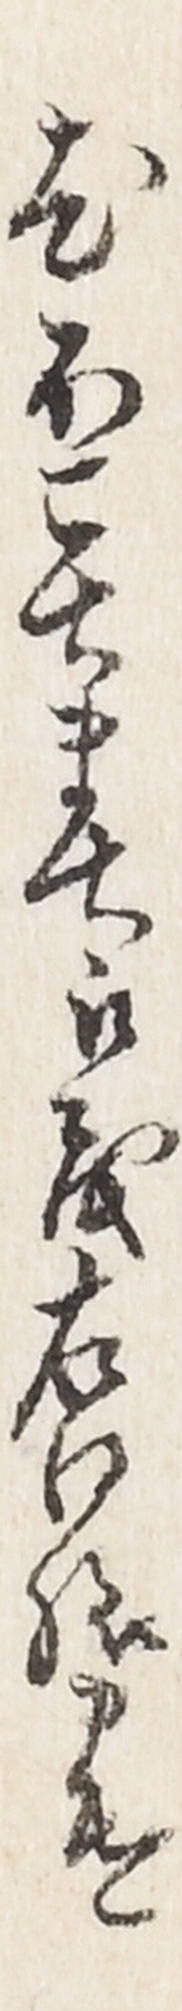尤ほこちまち江も右同様申出候
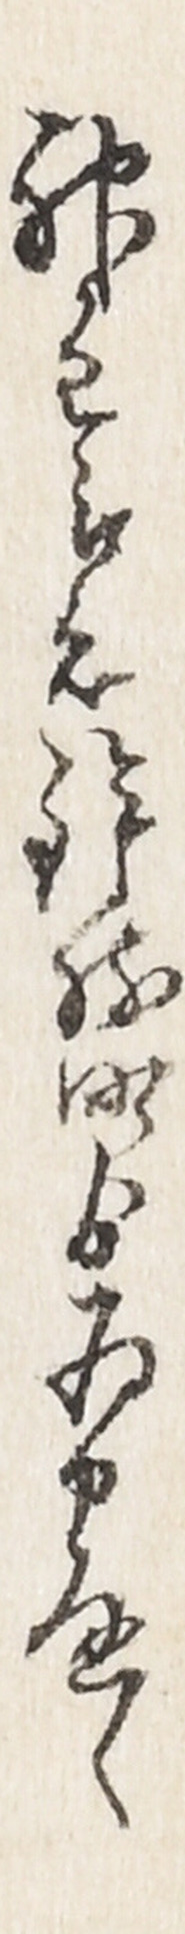神主江は鉾持町ゟ為申通候
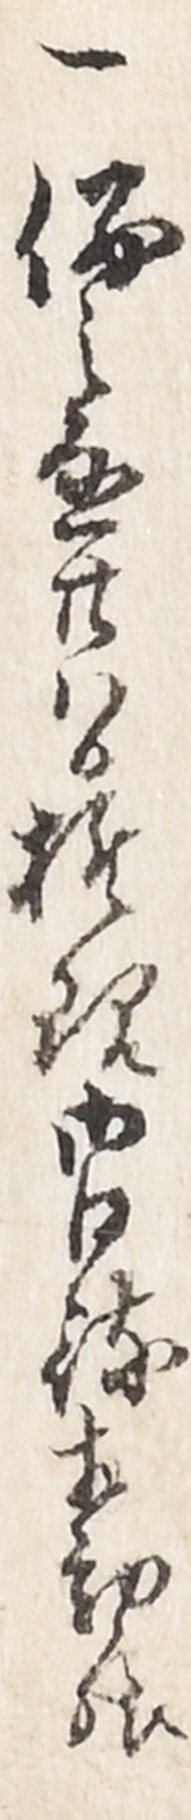一例之通廿八日権現御同流相勤候様
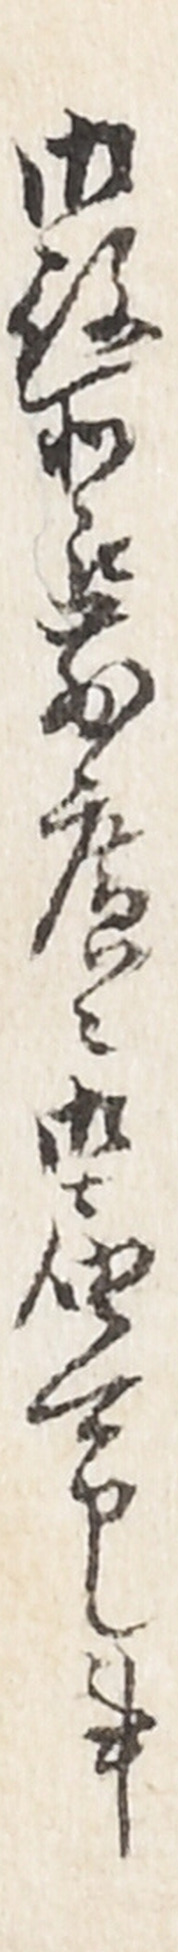御役所被前広ニ御届可申候事
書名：年内行事懐中録
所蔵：伊那市立高遠町図書館・合同会社AMANE
